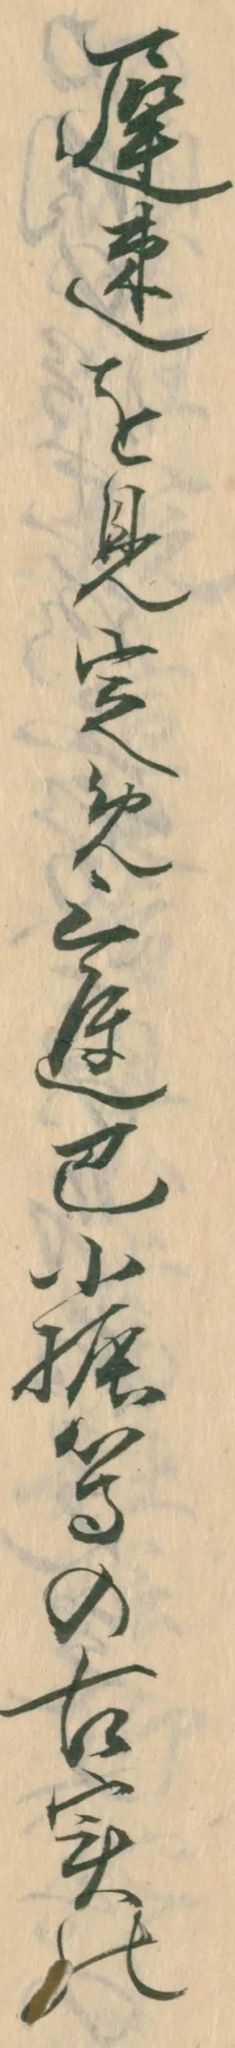遅速を見定め三遅巴小振等の古実の
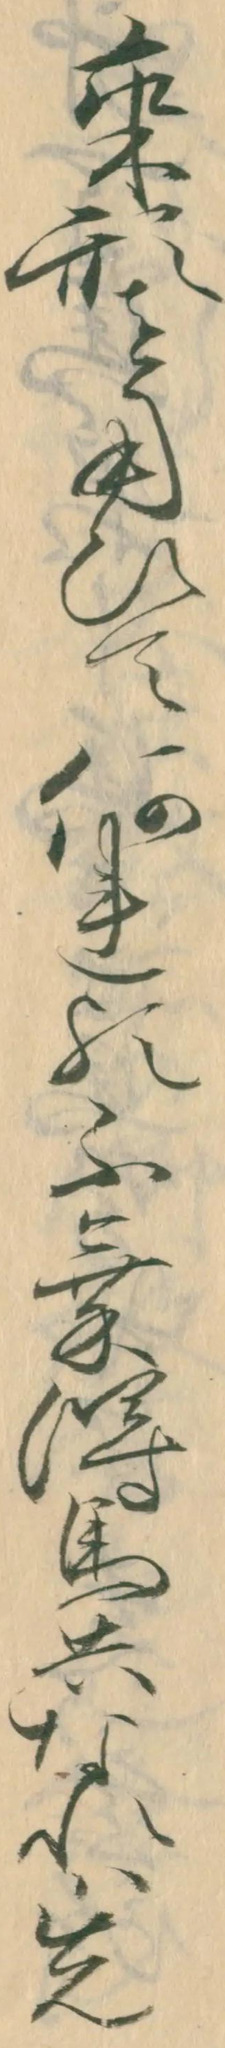乗形を用ひて何れ歟不乗得馬共なれは先

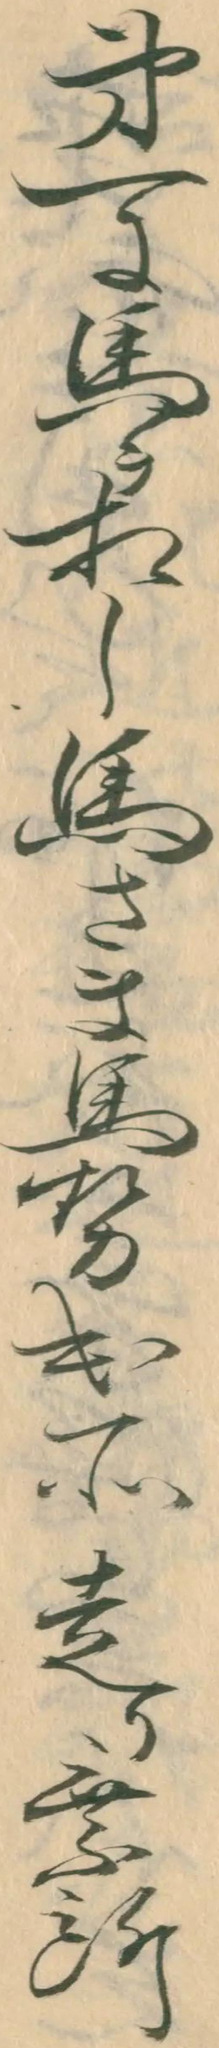第一に馬を相し馬さま馬勢出所走り乗所
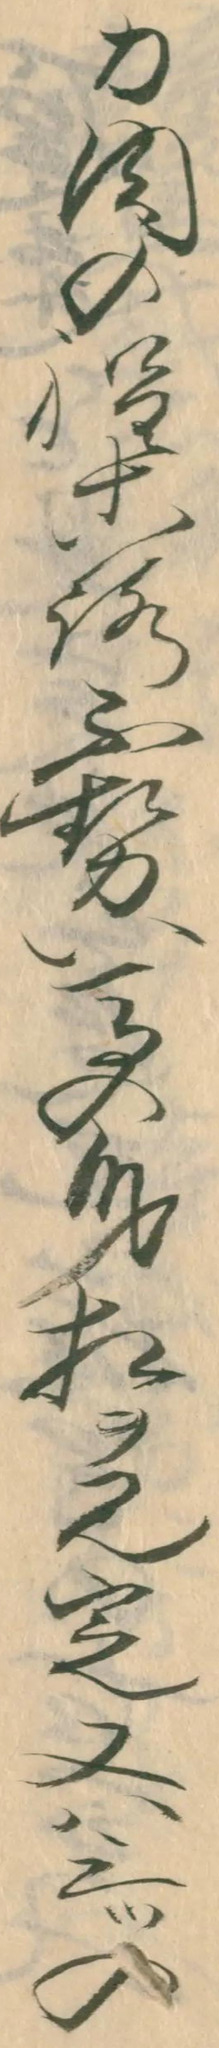力肉の程ころふ勢い馬の身相を見定又は三つの
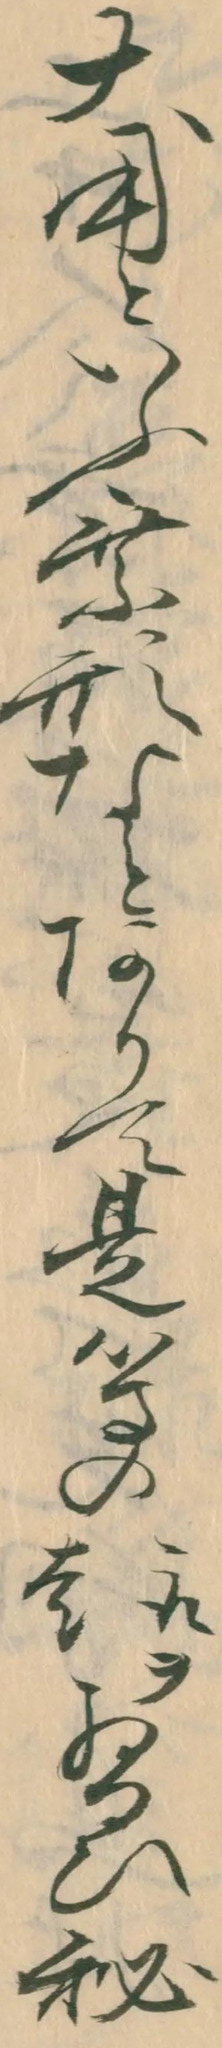大用といふ乗形なとありて是等の趣を習ひ秘
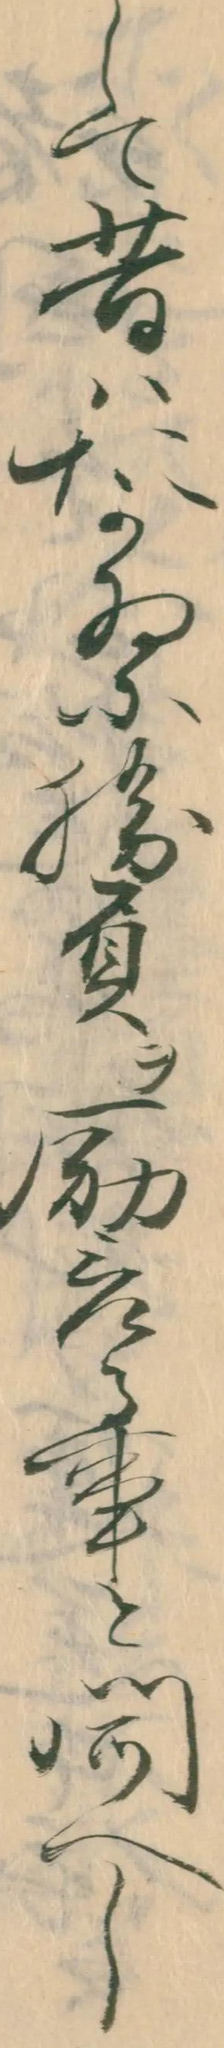して昔はたかゐに勝負を励差る事と聞へし
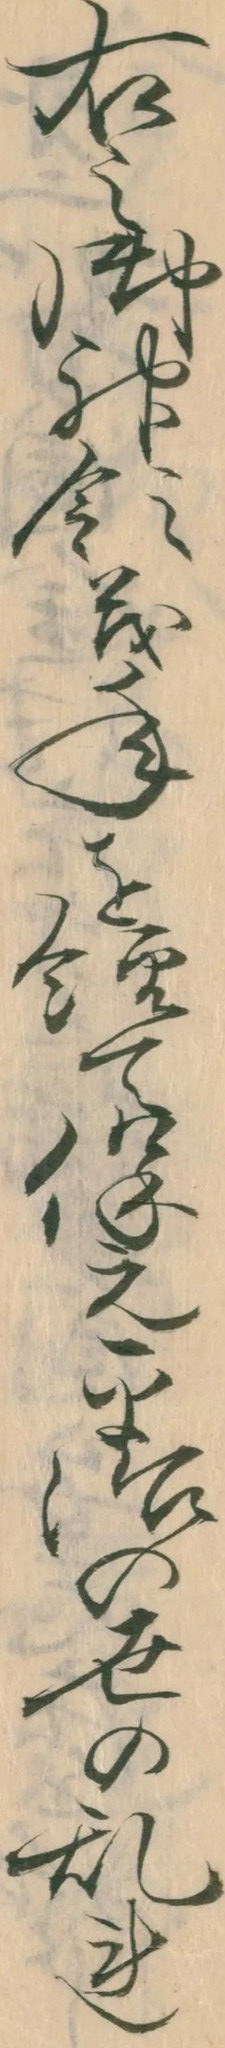右之御神領も年を経て保元平治の世の乱れ
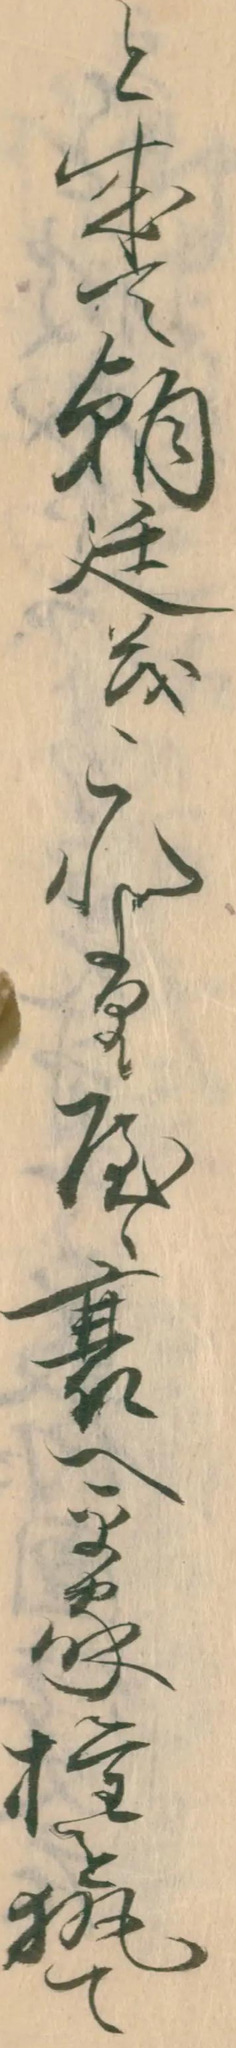と成て朝廷もこれよりやゝ衰へ平家権を執て
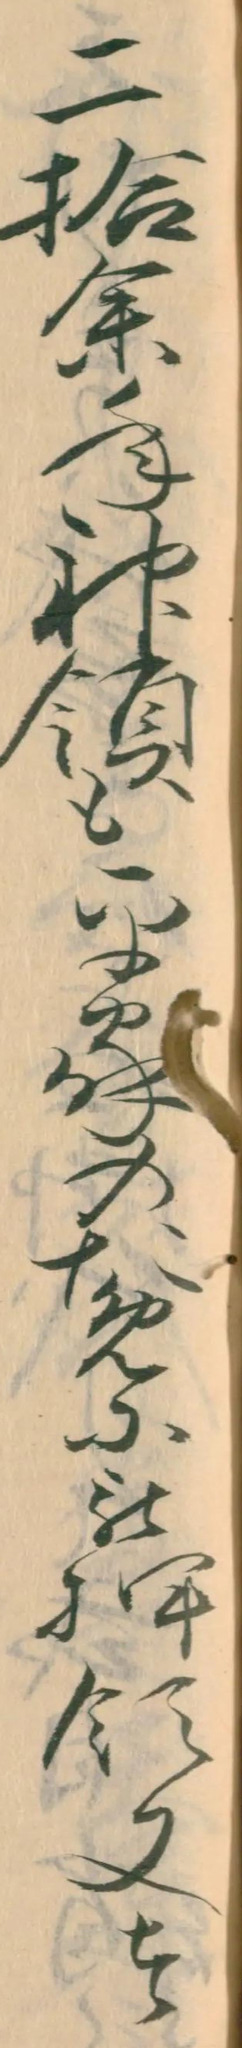二拾余年神領も平家のために被押領又は
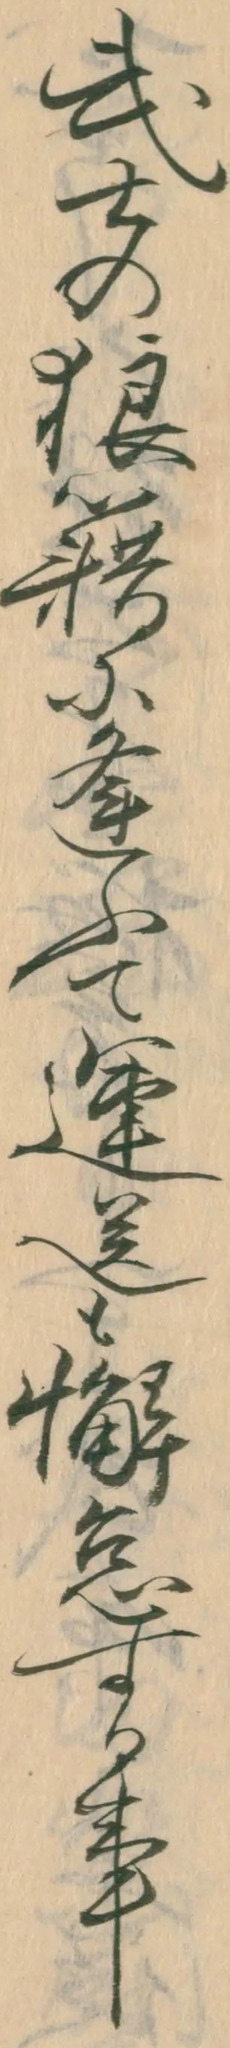武士の狼藉に逢ふて運送も懈怠する事
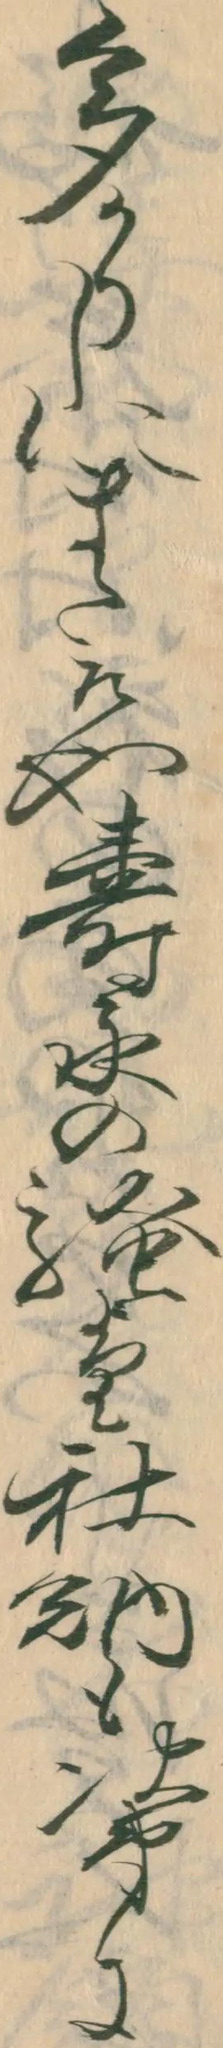多かりしにまた候や寿永の騒より社納も次第に
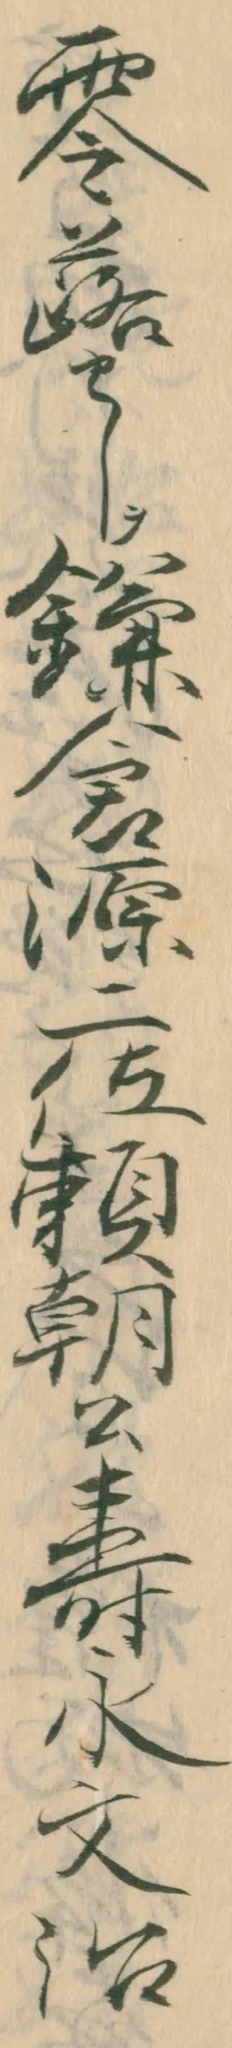零落せしを鎌倉源二位頼朝公寿永文治
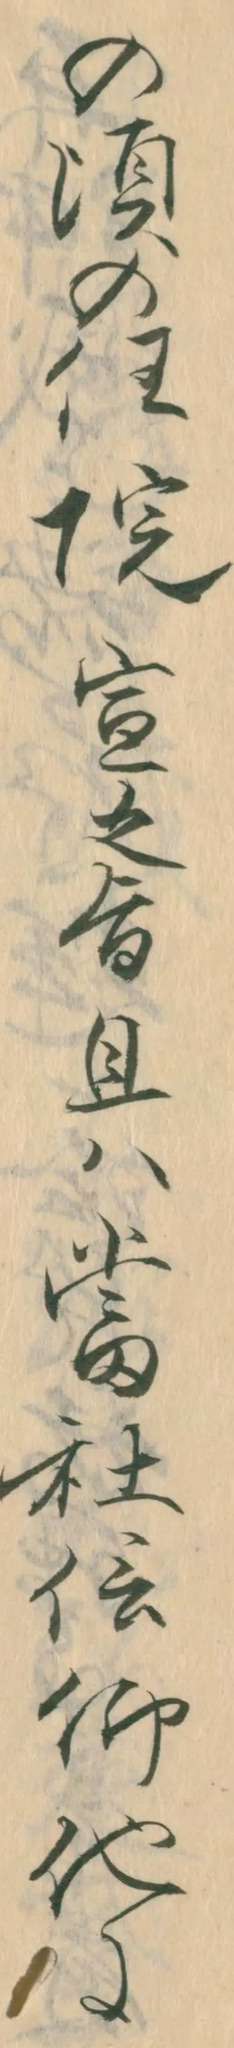の頃の任院宣之旨且は当社信仰他に
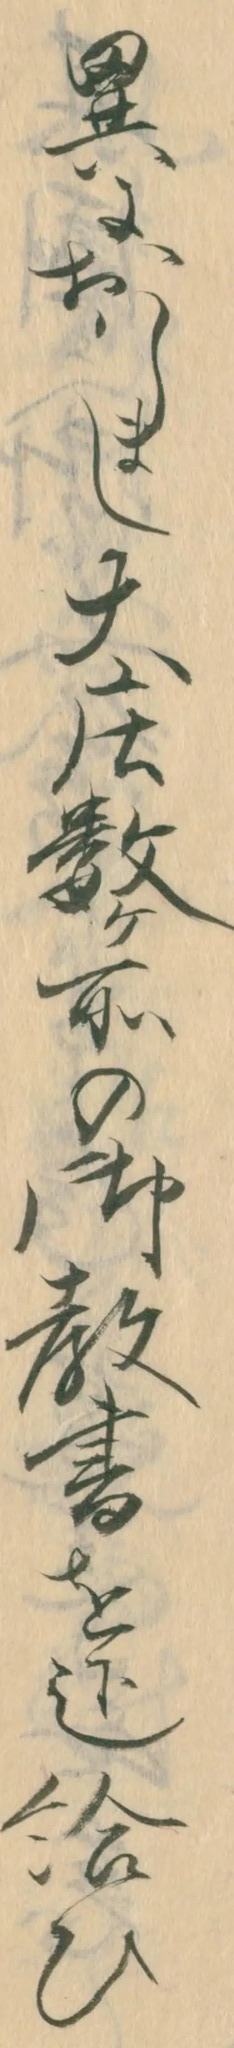異におはしまし大庄数ヶ所の御教書を下し給ひ

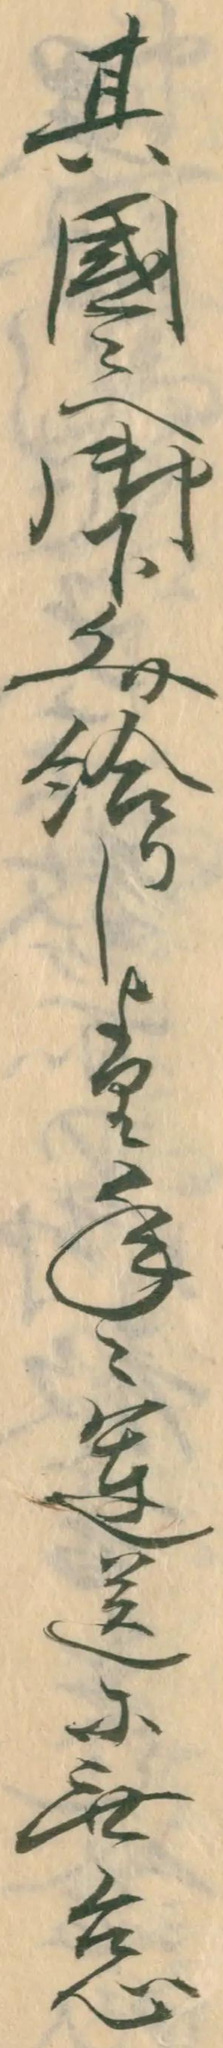其国々へ御下文給りしより年々運送無怠
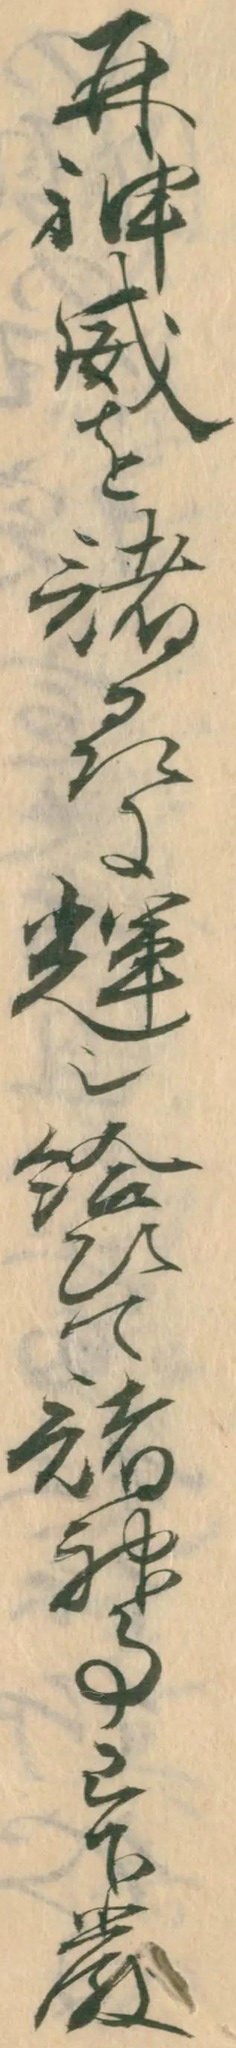再神威を諸州に輝し給ひて諸神事已下厳
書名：賀茂社記録. 第12冊
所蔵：国立国会図書館 National Diet Library, JAPAN
